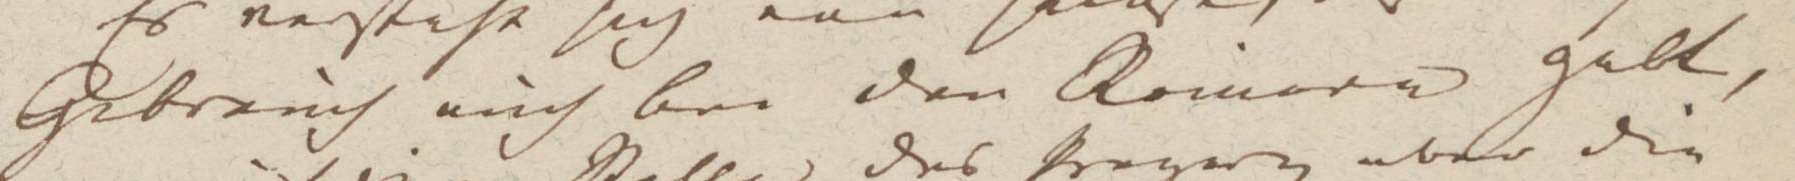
Gebrauch auch bei den Römern galt,
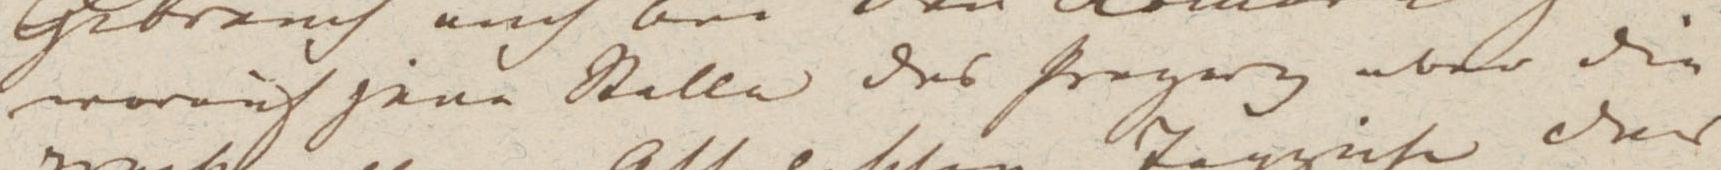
worauf jene Stelle des Properz uber die
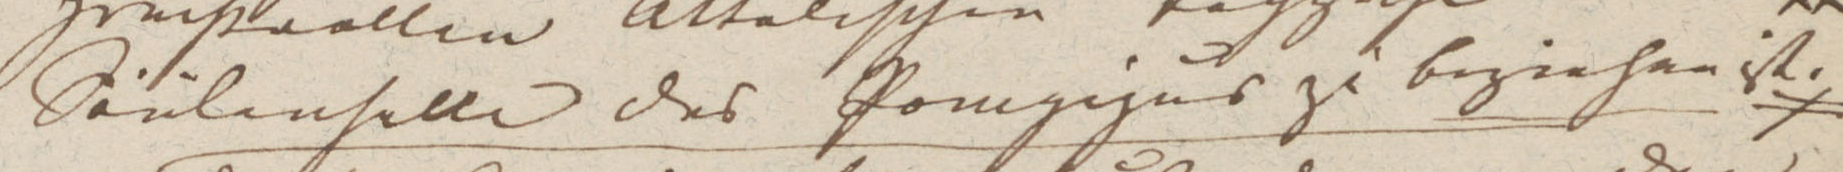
Säulenhalle des Pompejus zu beziehen ist.%%%
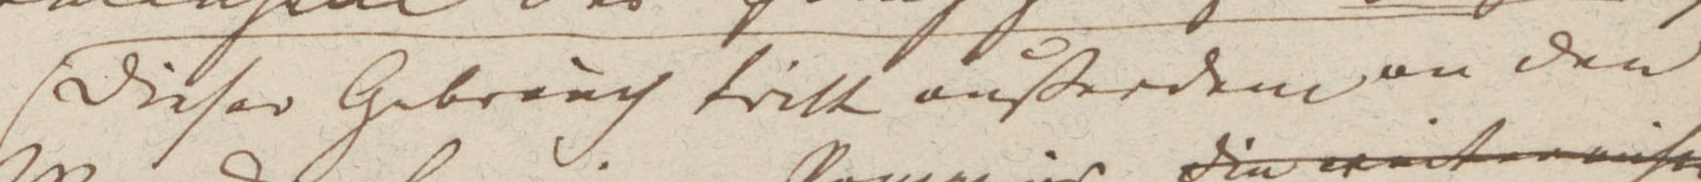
Dieser Gebrauch tritt ausserdem an den
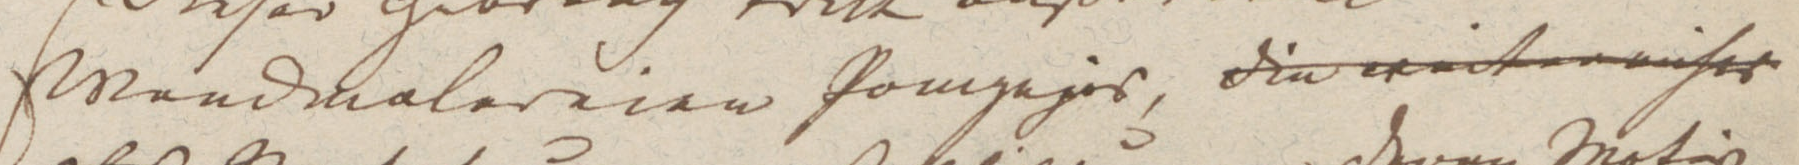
Wandmalereien Pompejis, die weiter nichts
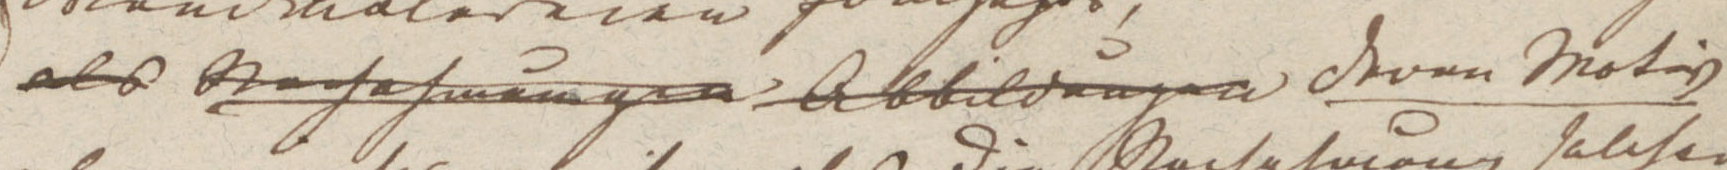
als Nachahmungen Abbildungen deren Motiv
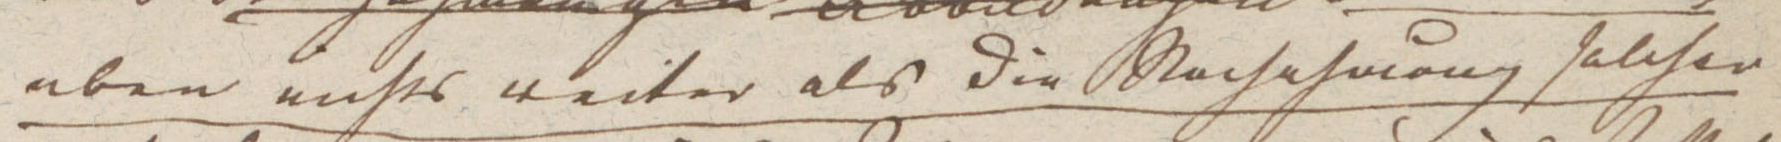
eben nichts weiter als die Nachahmung solcher
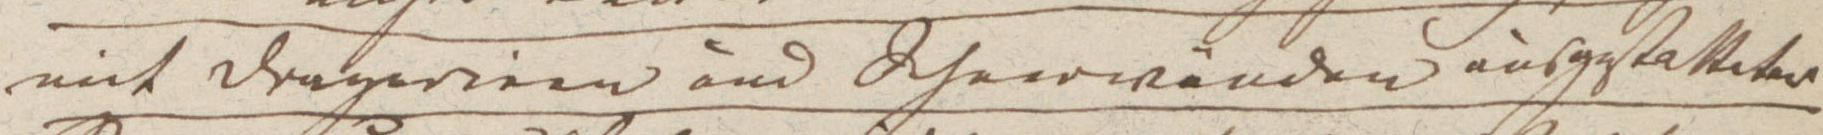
mit Draperieen und Scherwänden ausgestatteter
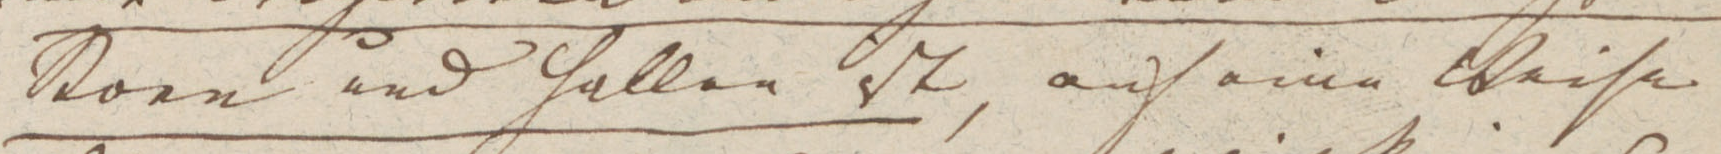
Stoen und Hallen ist, auf eine Weise
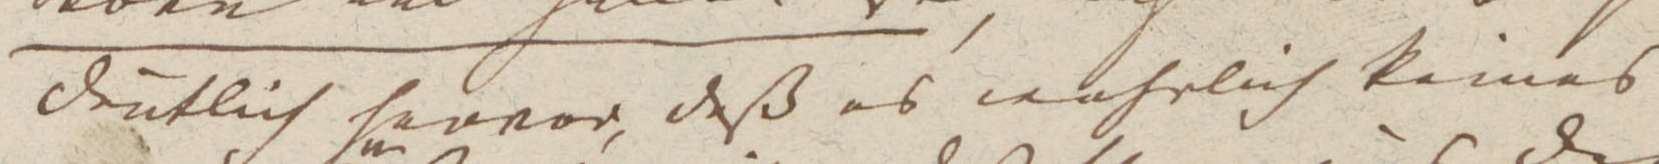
deutlich hervor, dass es wahrlich keines
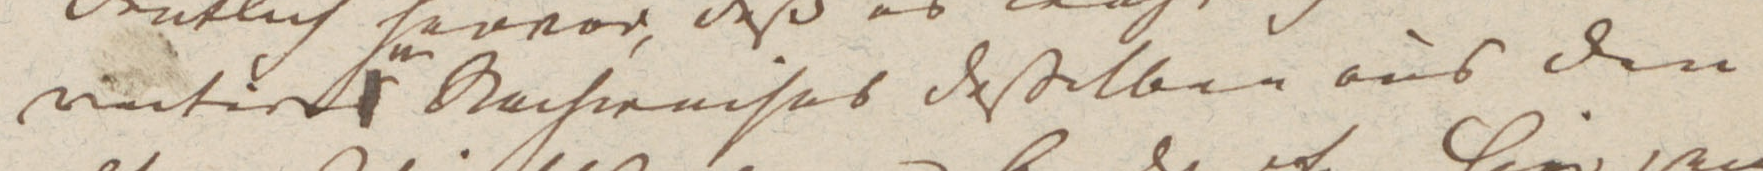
weiteresn Nachweises desselben aus den
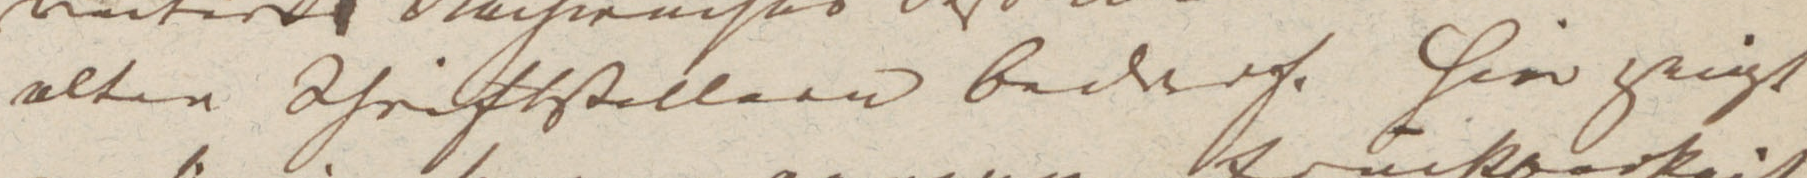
alten Schriftstellern bedarf. Hier zeigt
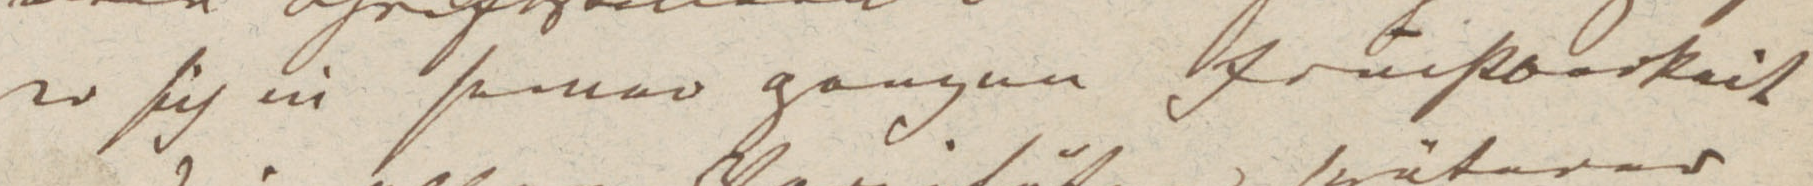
er sich in seiner ganzen Fruchtbarkeit
